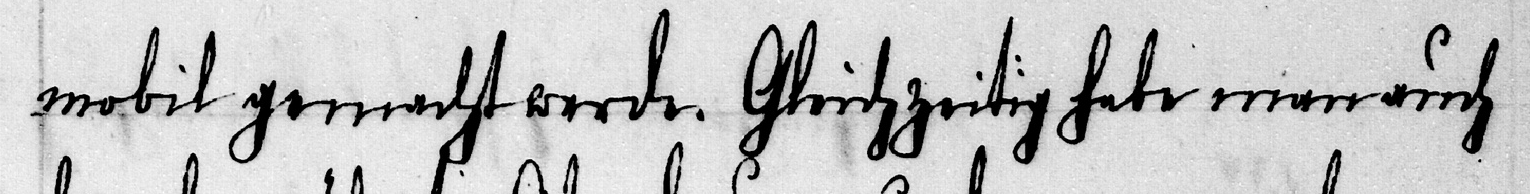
mobil gemacht werde. Gleichzeitig habe man auch
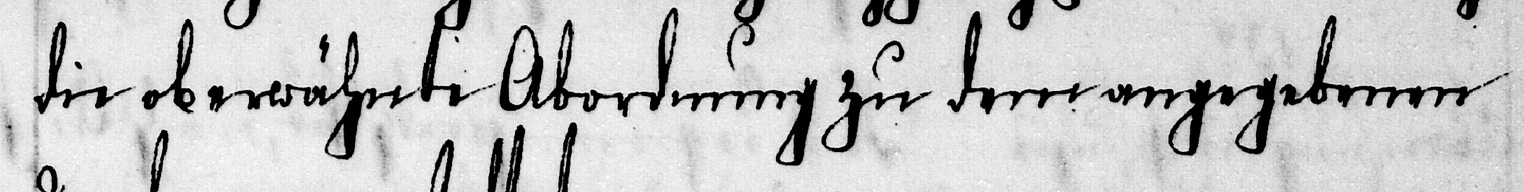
die oberwähnte Abordnung zu dem angegebenen
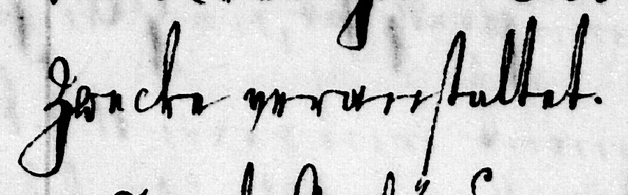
Zwecke veranstaltet.
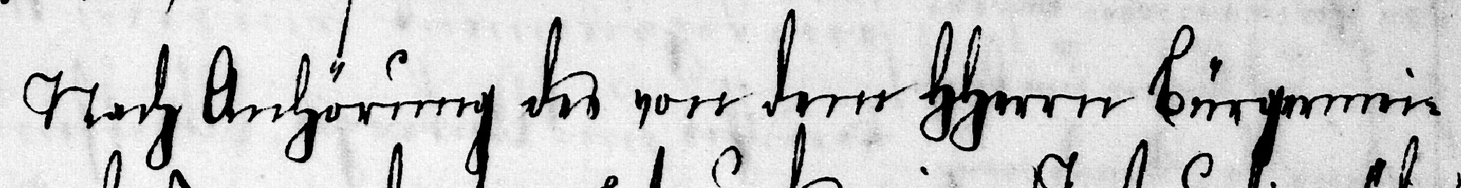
Nach Anhörung des von dem HHerrn Bürgermeis¬
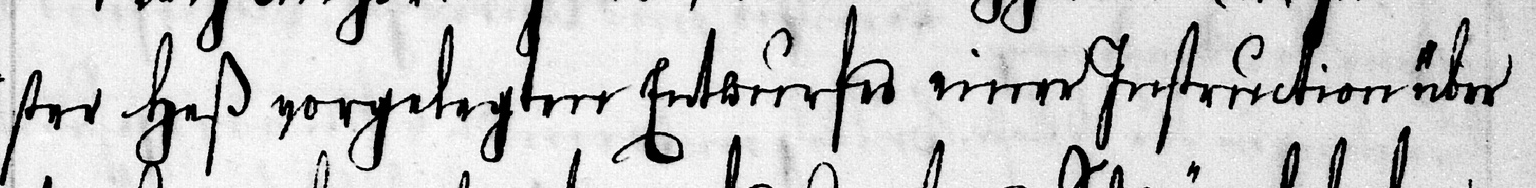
ter Heß vorgelegten Entwurfes einer Instruction über
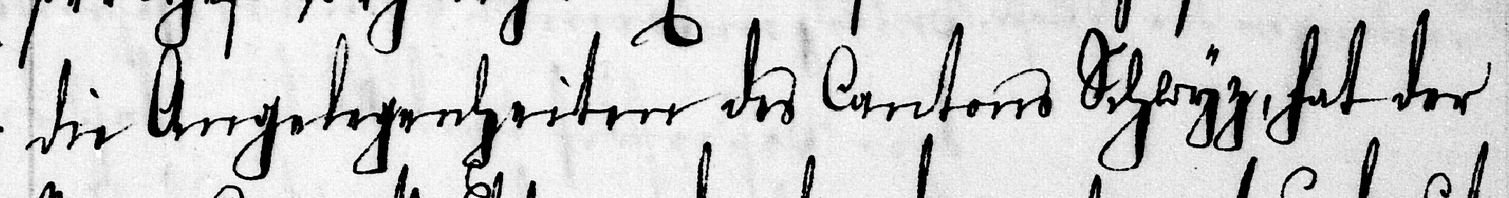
die Angelegenheiten des Cantons Schwyz, hat der
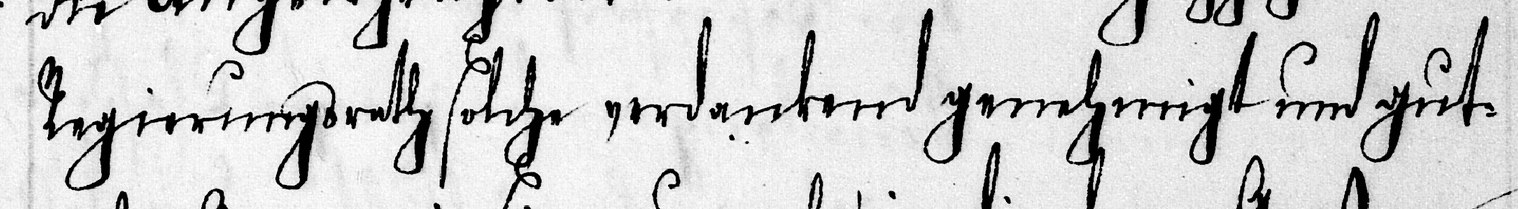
Regierungsrath solche verdankend genehmigt und gut¬
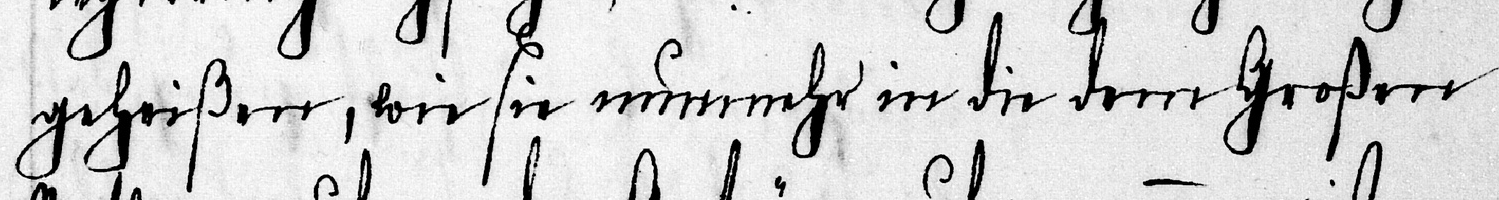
geheißen, wie sie nunmehr in die dem Großen
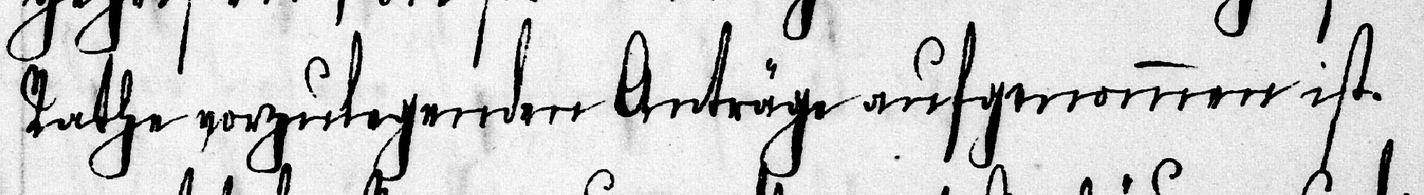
Rathe vorzulegenden Anträge aufgenommen ist.
